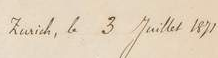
Zurich, le 3 Juillet 1871
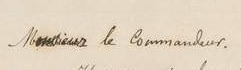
Monsieur le Commandeur.
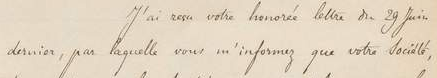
dernier, par laquelle vous m'informez que votre Société,
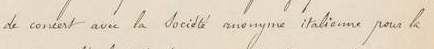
de concert avec la Société anonyme italienne pour la
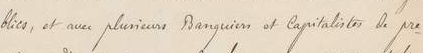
blics, et avec plusieurs Banquiers et Capitalistes de pre-
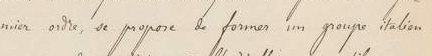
mier ordre, se propose de former un groupe italien
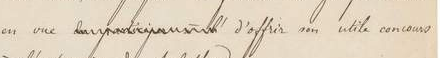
en vue de participer à l' d'offrir son utile concours
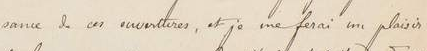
sance de ces ouvertures, et je me ferai un plaisir
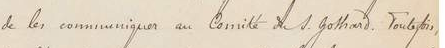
de les communiquer au Comité du S. Gothard. Toutefois,
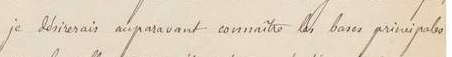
je désirerais auparavant connaître les bases principales
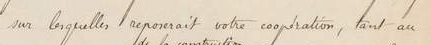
sur lesquelles reposerait votre coopération, tant au
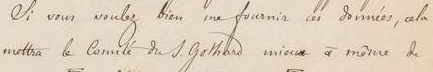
vous voulez bien me fournir ces
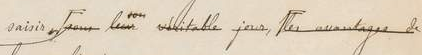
saisir sous leursonvéritable jour, les avantages de
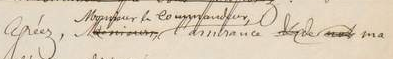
Agréez, Monsieur,Monsieur le Commandeur,
